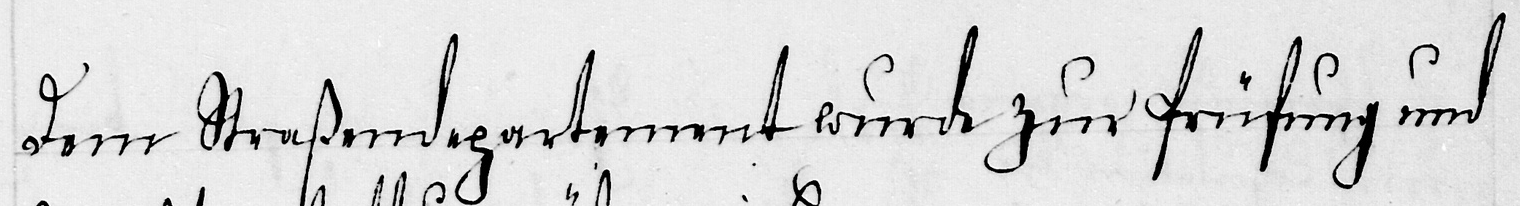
Dem Straßendepartement wurde zur Prüfung und
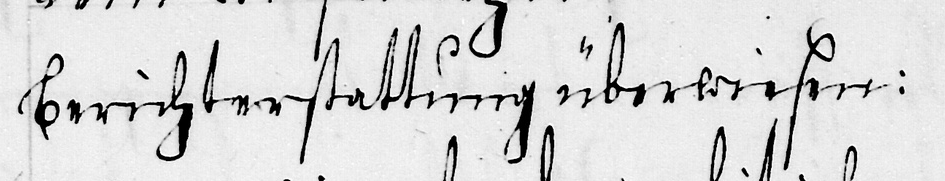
Berichterstattung überwiesen:
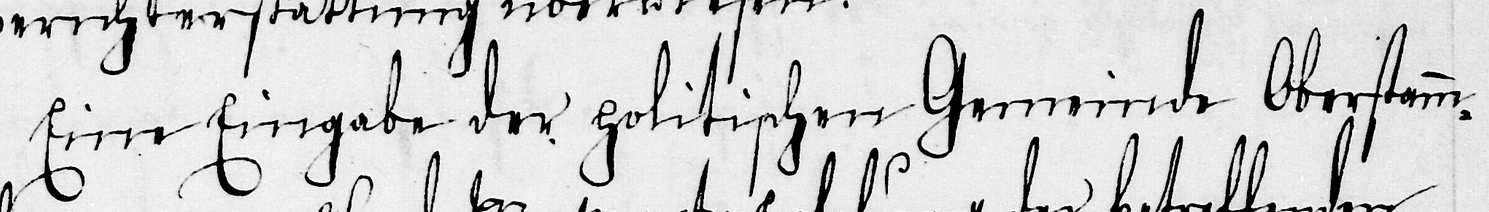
Eine Eingabe der politischen Gemeinde Oberstam¬
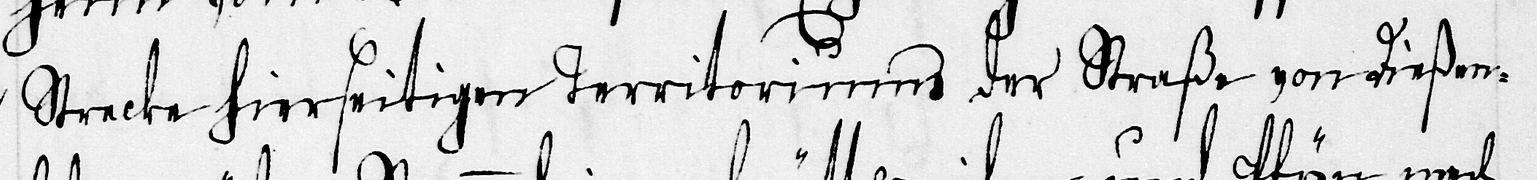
Strecke hierseitigen Territoriums der Straße von Dießen¬
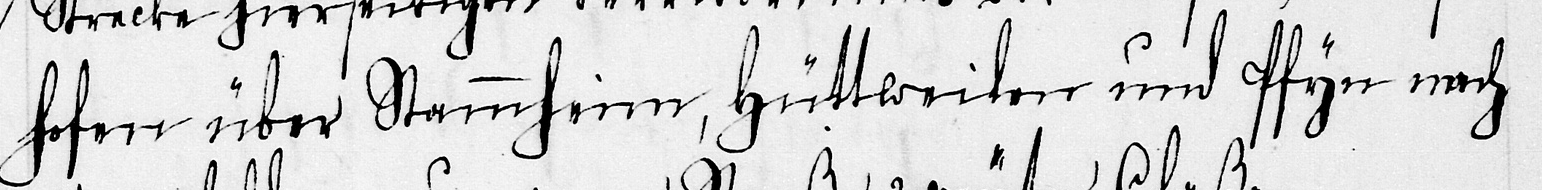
hofen über Stammheim, Hüttweilen und Pfyn nach
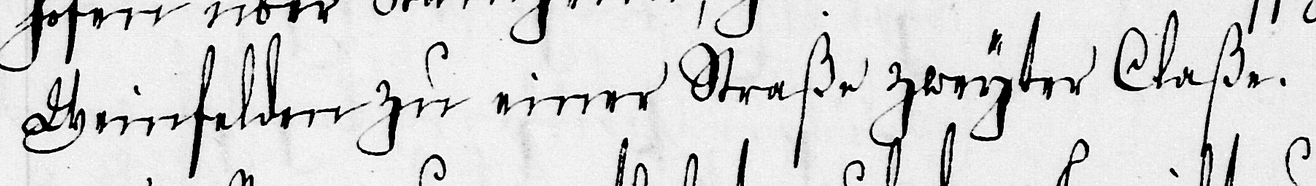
Weinfelden zu einer Straße zweyter Claße.
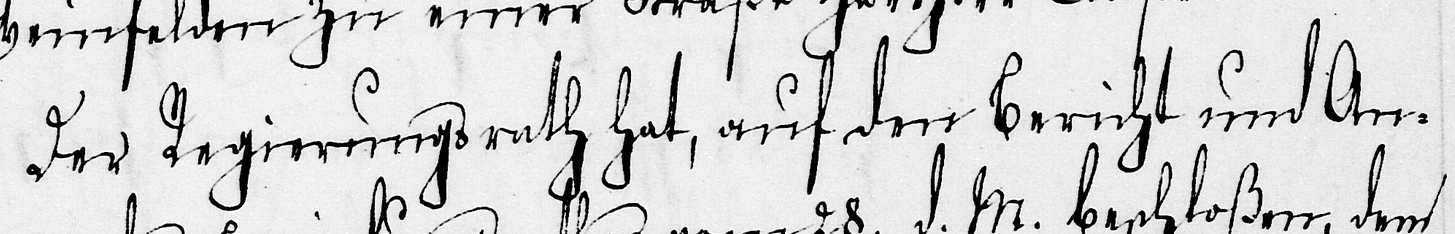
Der Regierungsrath hat, auf den Bericht und An¬
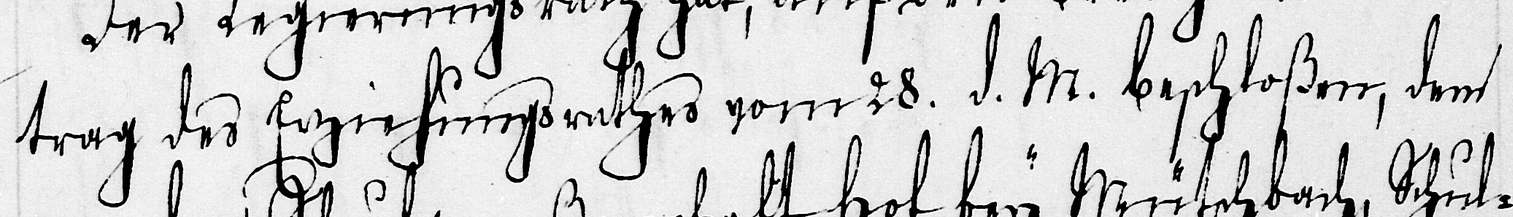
trag des Erziehungsrathes vom 28. d. M. beschloßen, dem
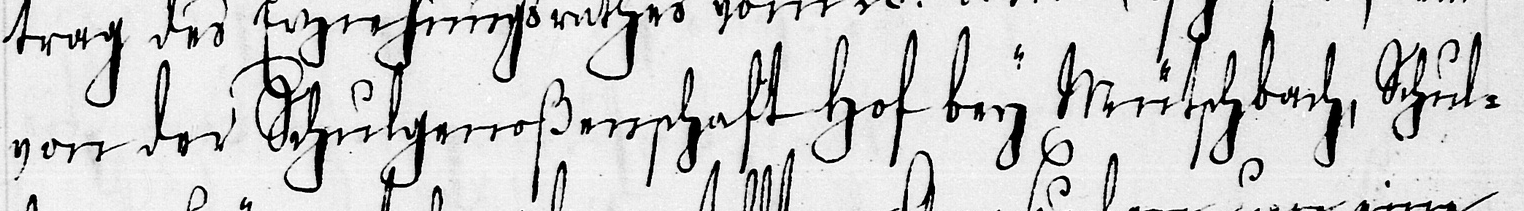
von der Schulgenoßenschaft Hof bey Mütschbach, Schul¬
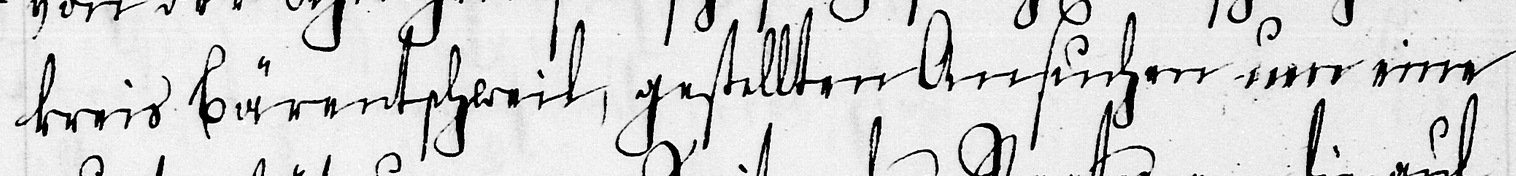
kreis Bärentschweil, gestellten Ansuchen um eine
